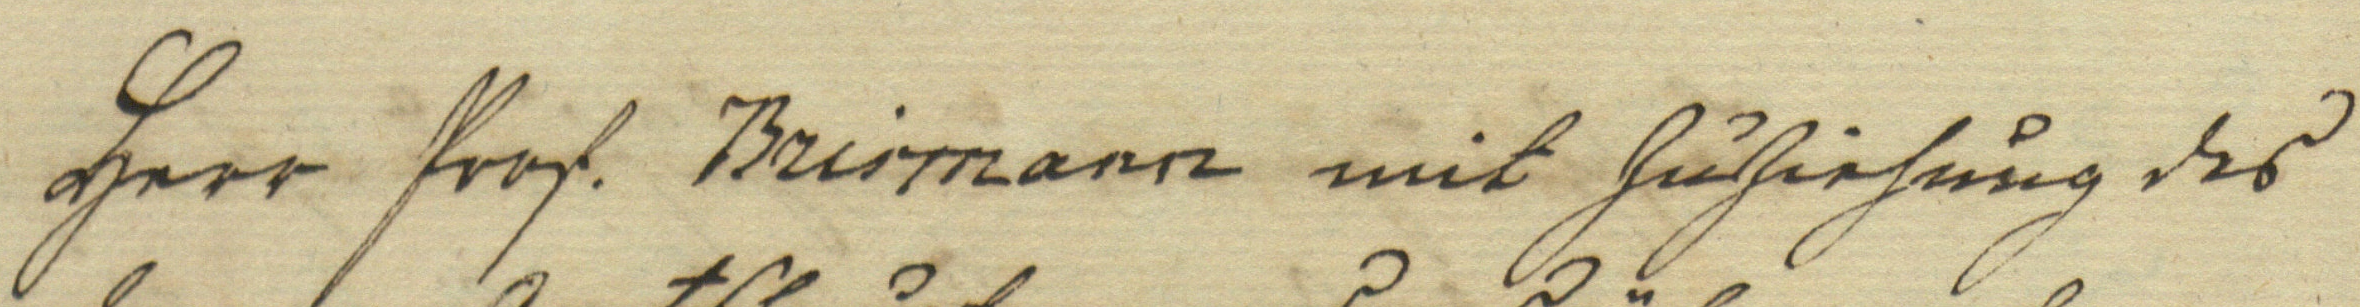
Herr Prof. Brismann mit Zuziehung des
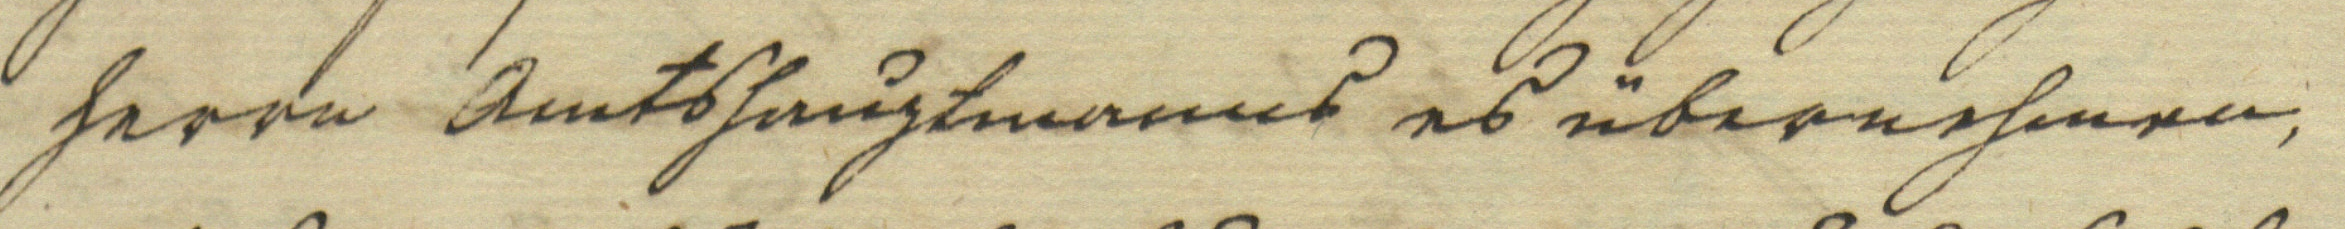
Herrn Amtshauptmanns es übernehmen,
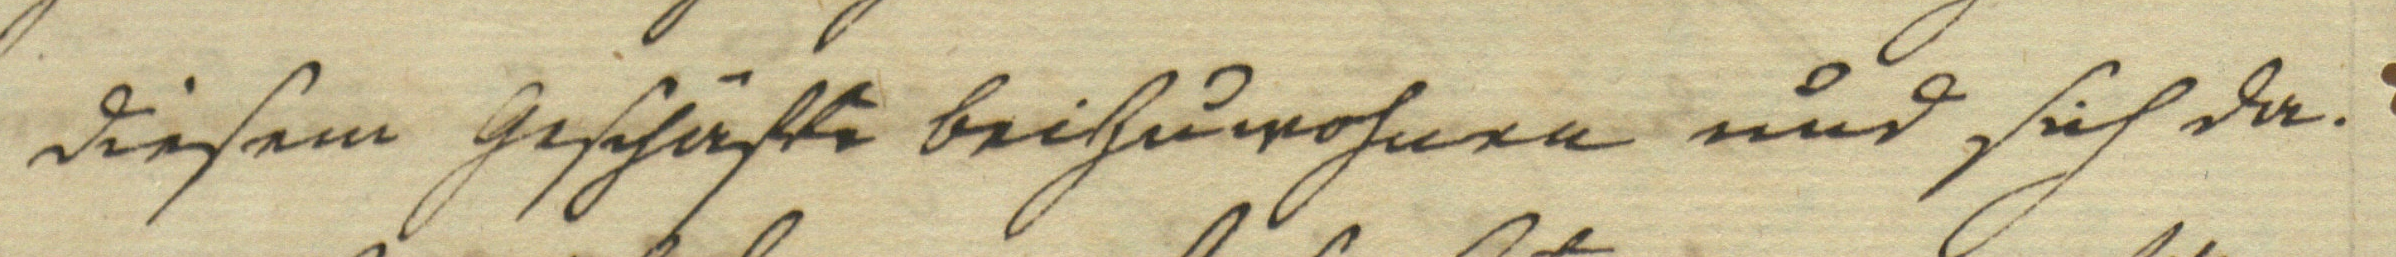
diesem Geschäfte beizuwohnen und sich da¬
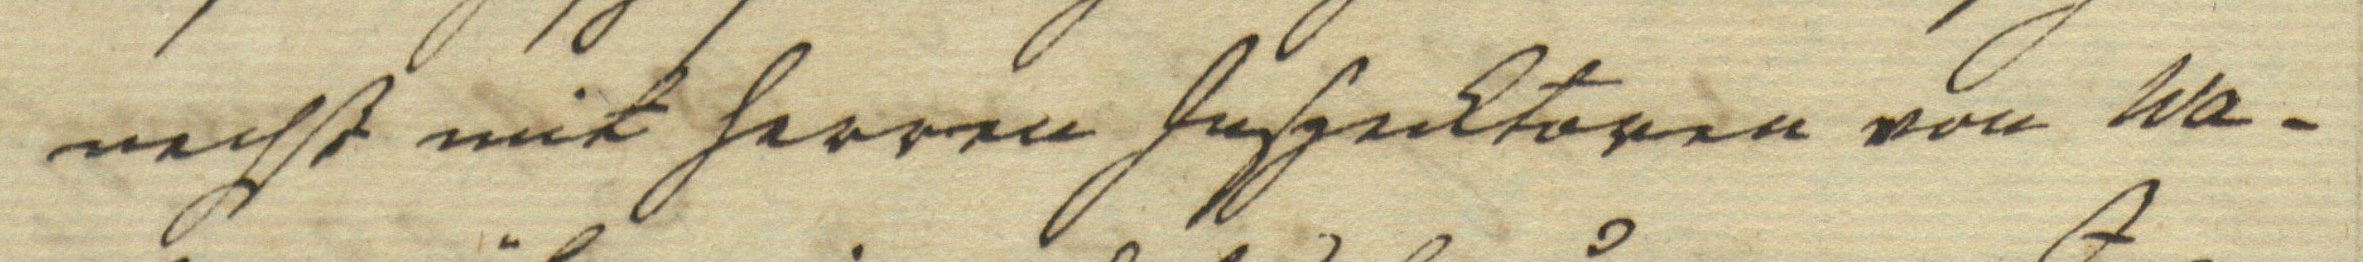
nechst mit Herren Inspecktoren von Wa¬
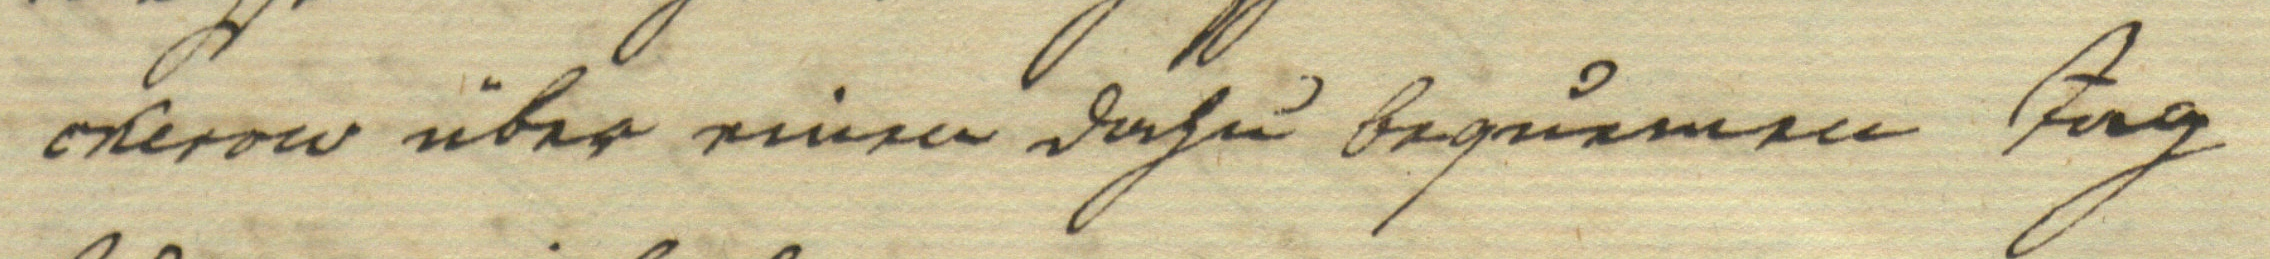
ckerow über einen dazu bequemen Tag
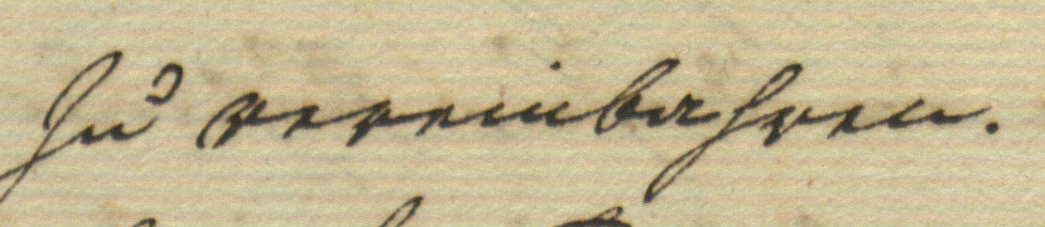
zu vereinbahren.
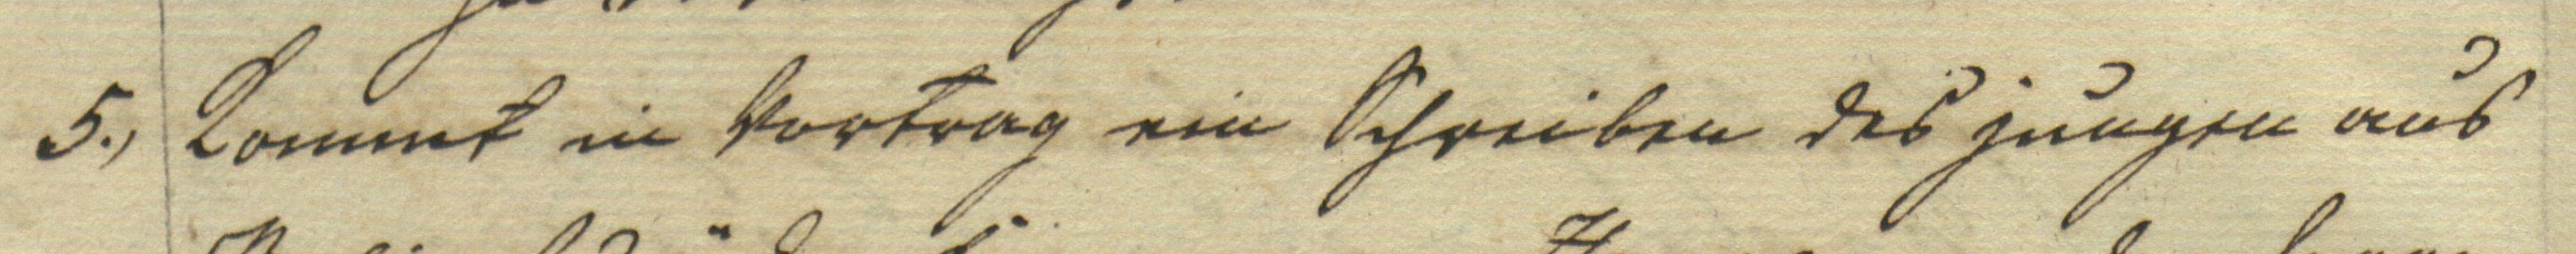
5. Kommt in Vortrag ein Schreiben des jungen aus
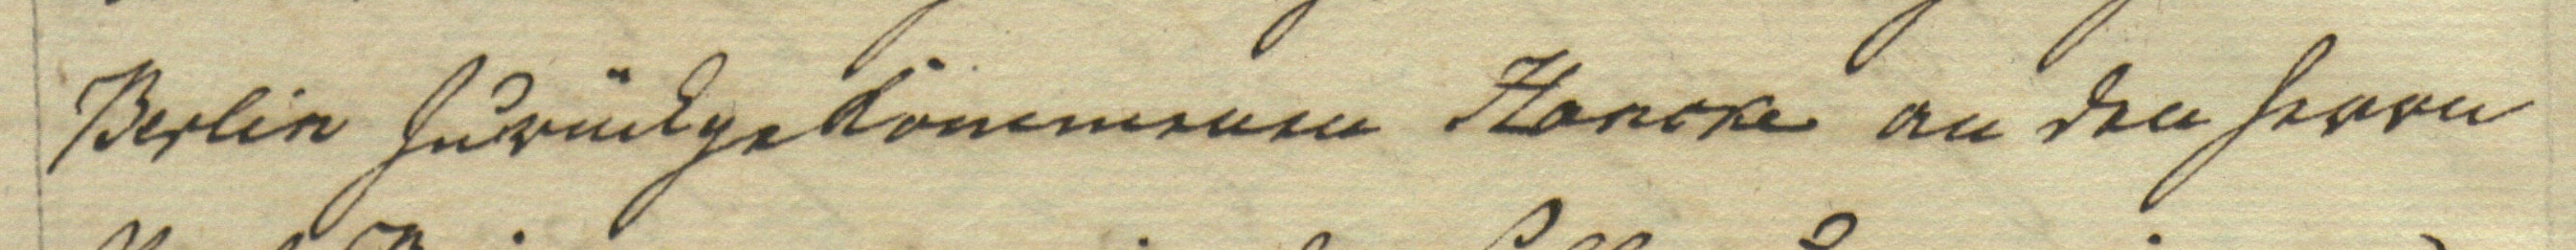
Berlin zurückgekommenen Hancke an den Herrn
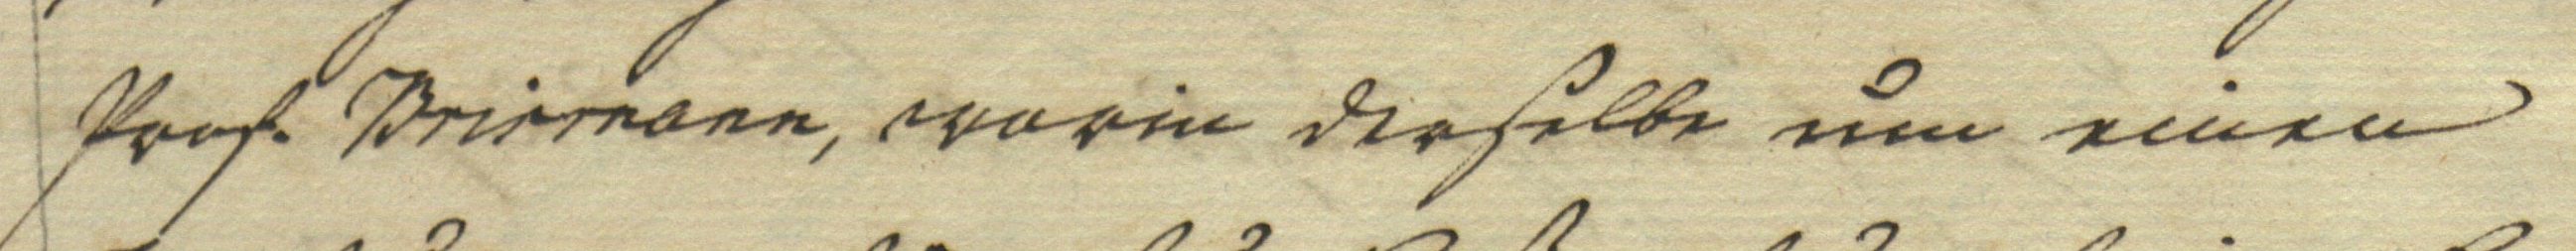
Prof. Brismann, worin derselbe um einen
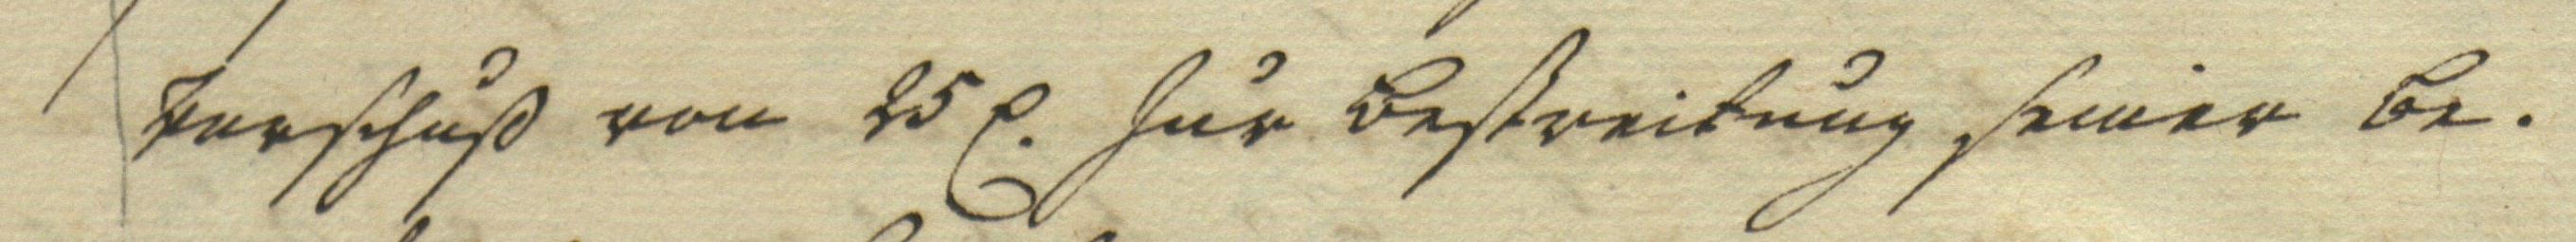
Vorschuß von 25 l. zur Bestreitung seiner Be¬
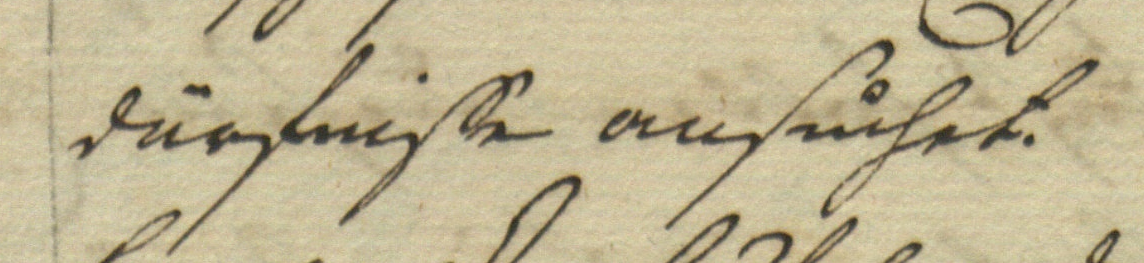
dürfnisse ansuchet.
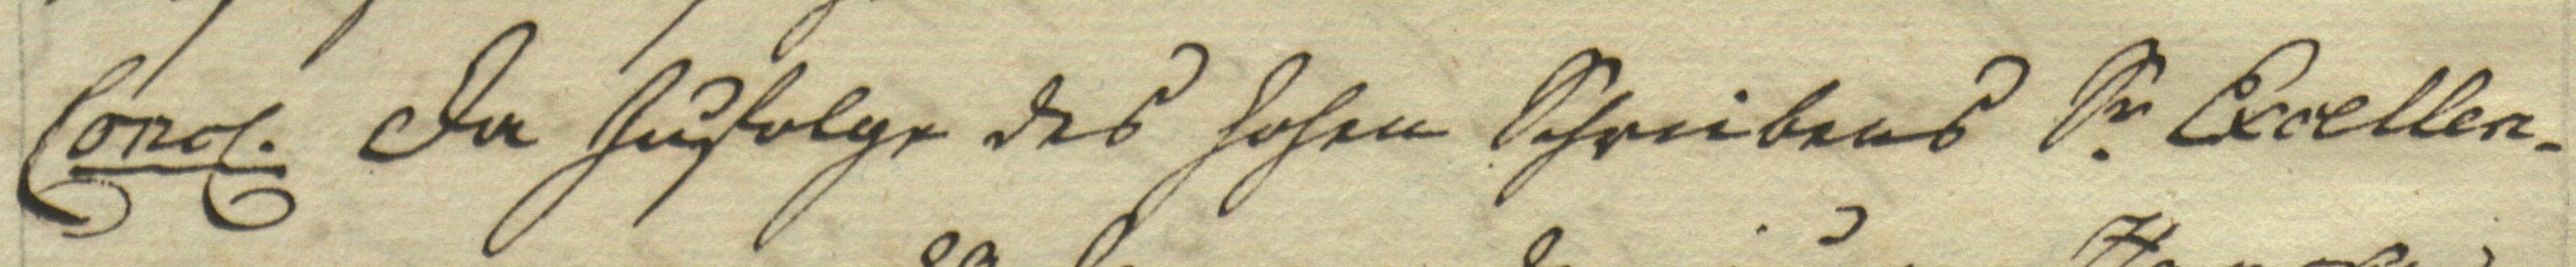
Concl. Da zufolge des hohen Schreibens Sr Excellen¬
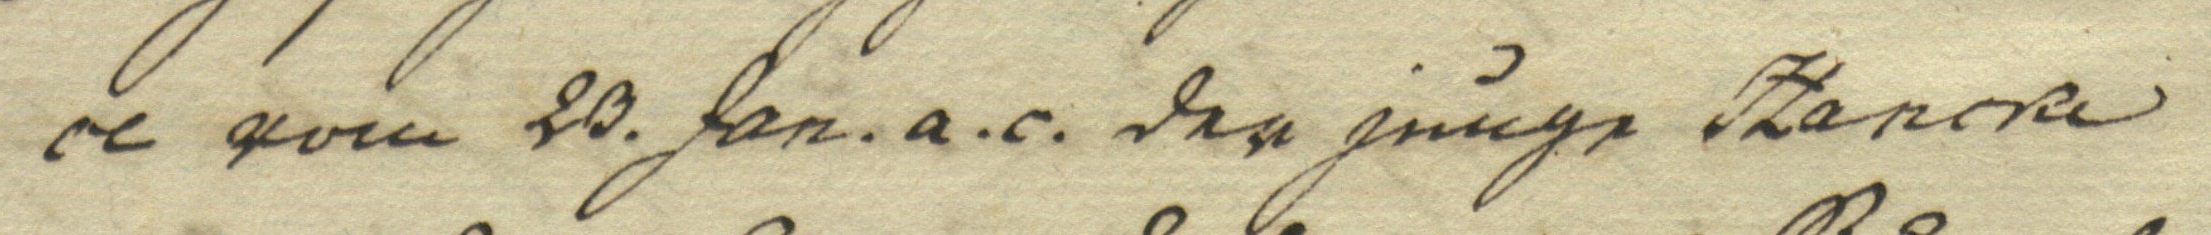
ce vom 23. Jan. a. c. der junge Hancke
